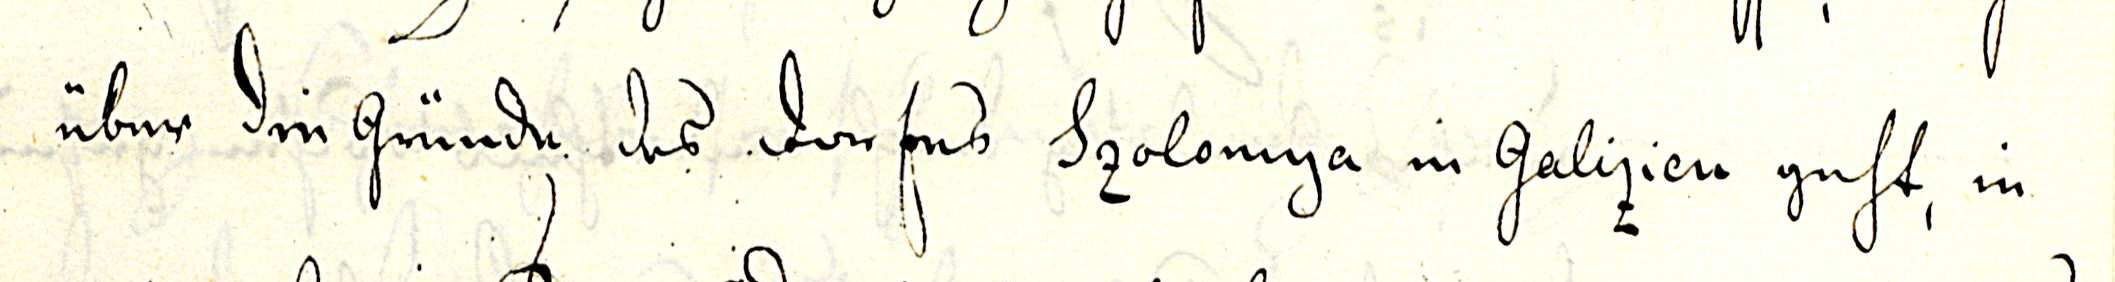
über die Gründe des Dorfes Szolomya in Galizien geht, in
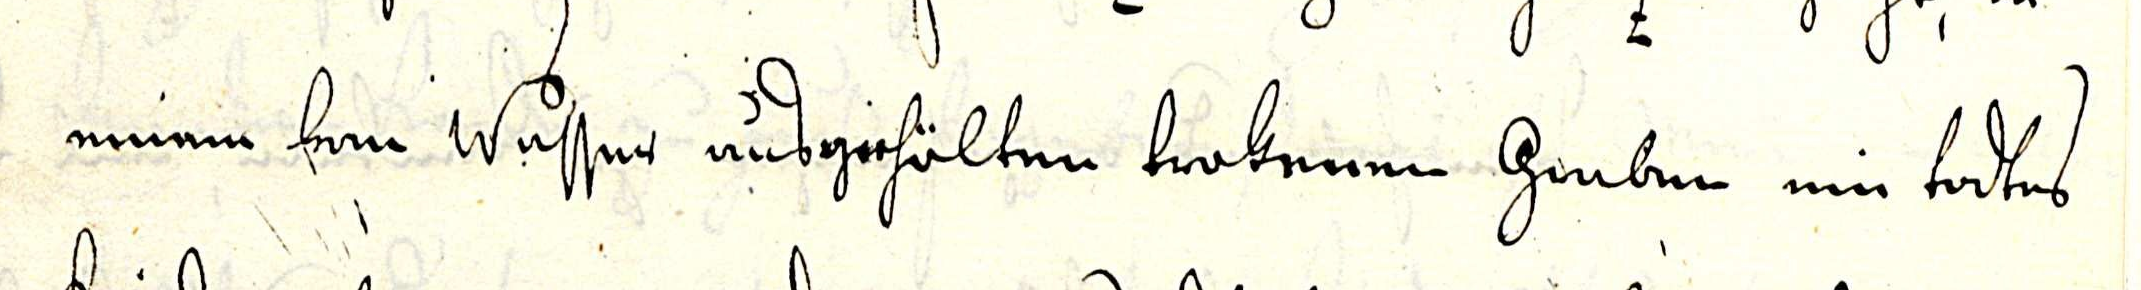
einem vom Wasser ausgehölten trokenen Graben ein todtes
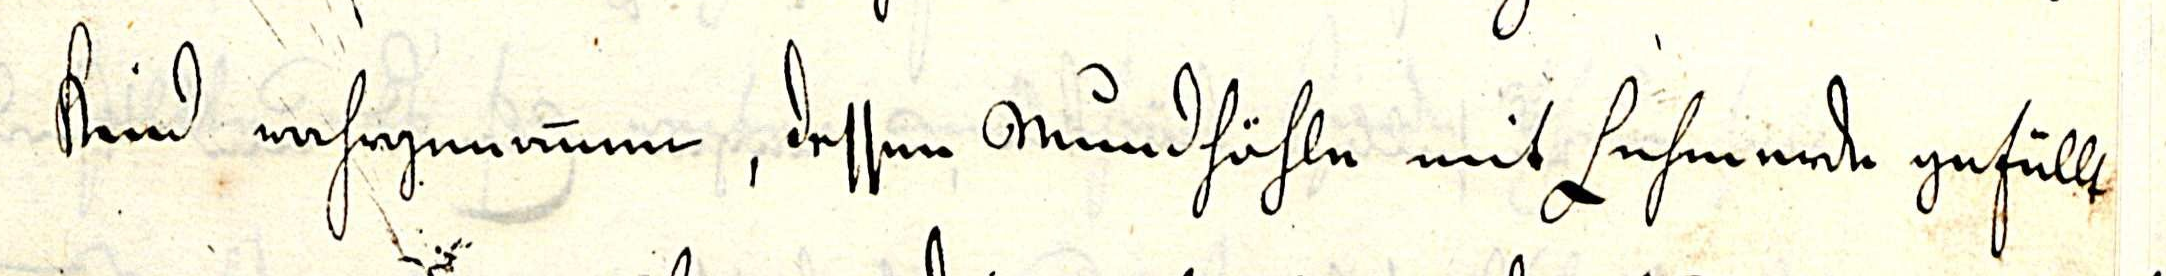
Kind wahrgenommen, dessen Mundhöhle mit Lehmerde gefüllt
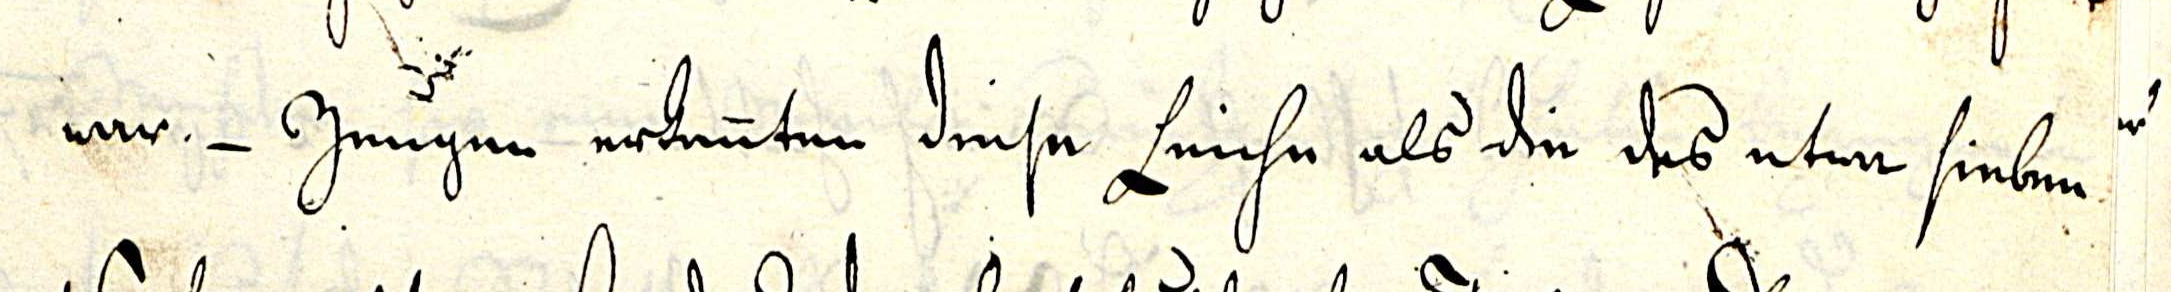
war. Zeugen erkannten diese Leiche als die des etwa sieben
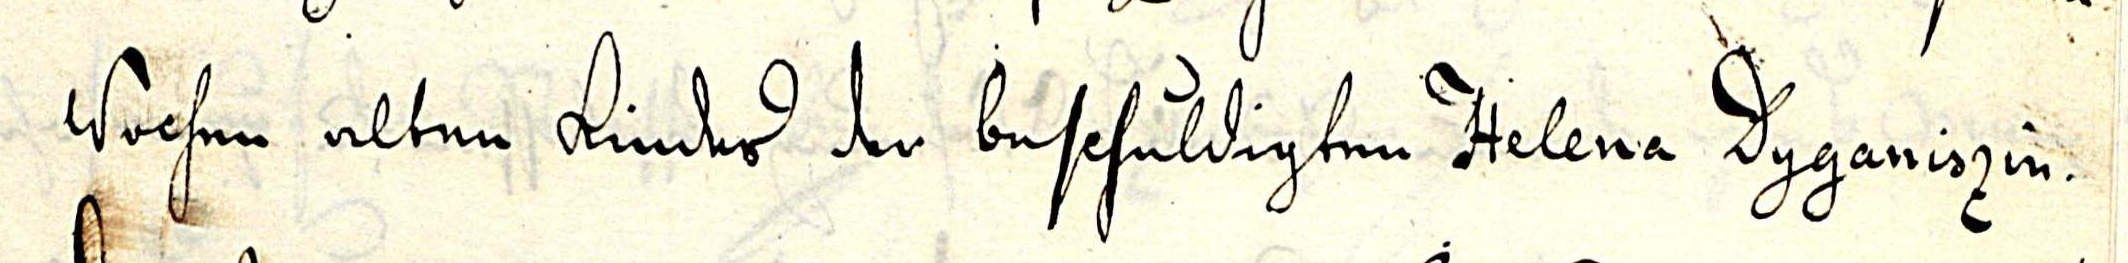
Wochen altes Kindes der beschuldigten Helena Dyganiszin.
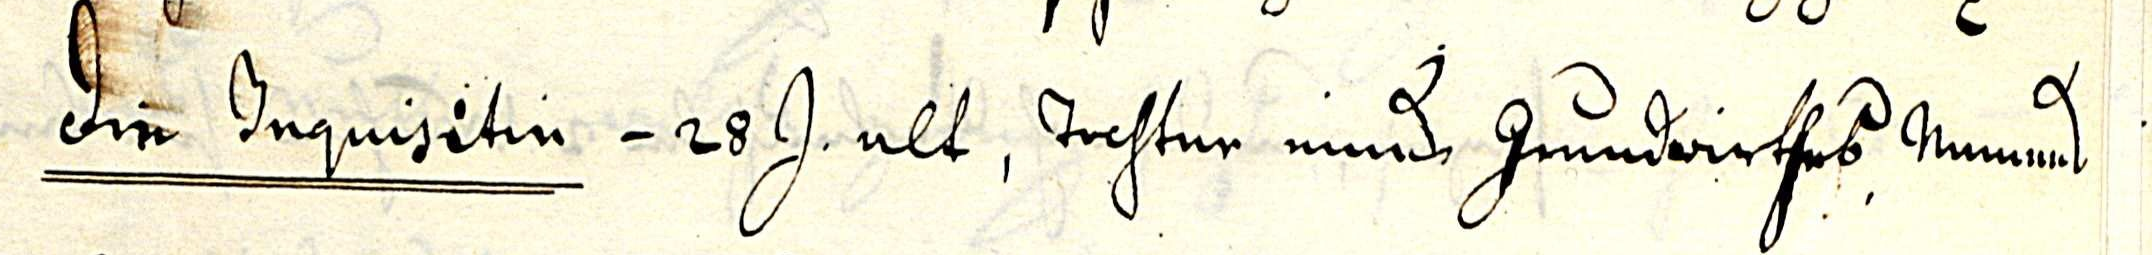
Die Inquisiten – 28 J. alt, Tochter eines Grundwirthes Namens
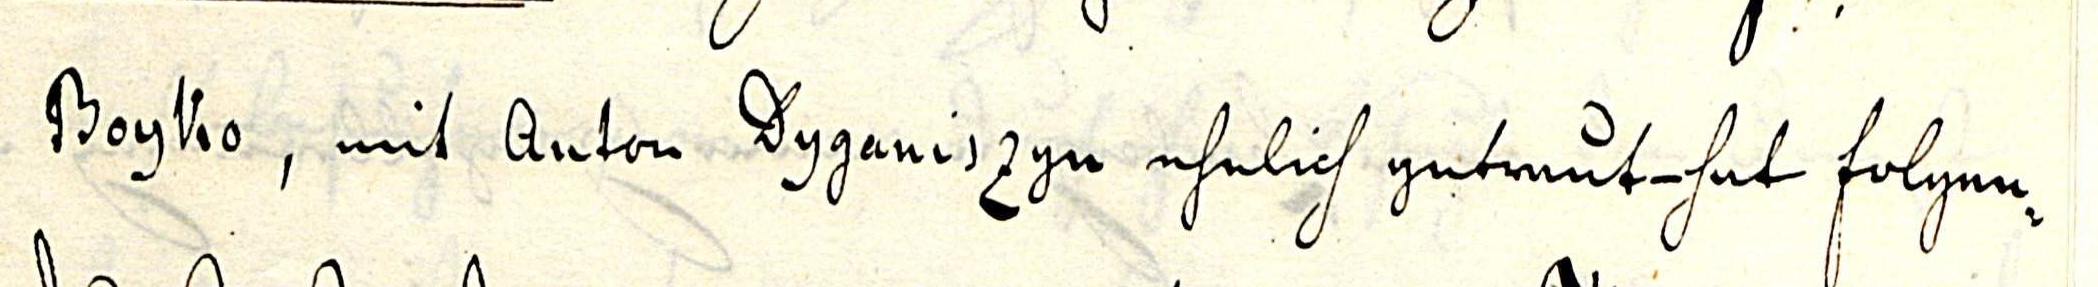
Boyko, mit Anton Dyganiszyn ehelich getraut – hat folgen¬
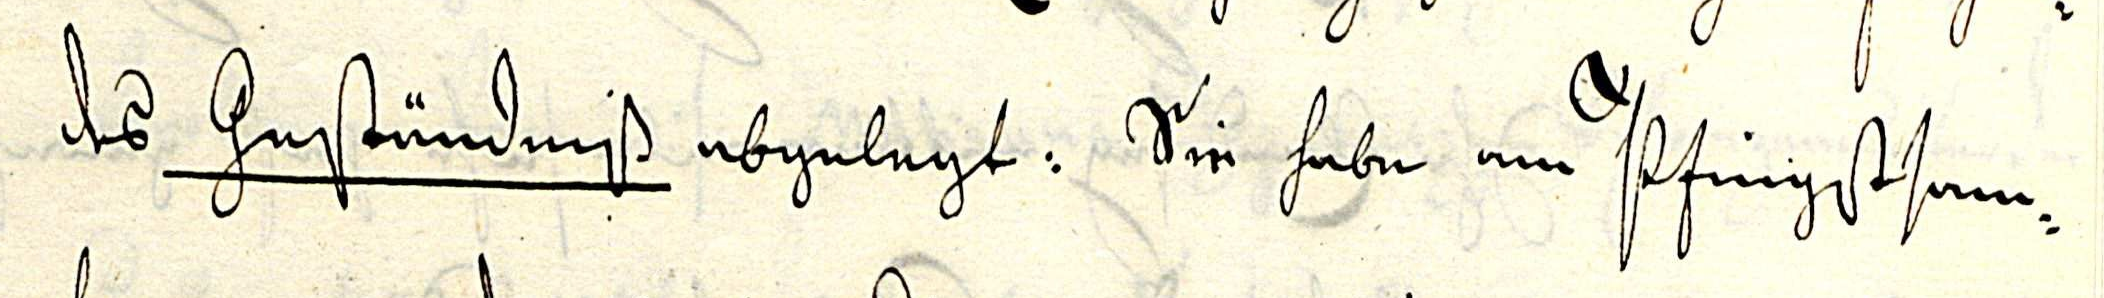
des Geständniß abgelegt: Sie habe am Pfingstsam¬
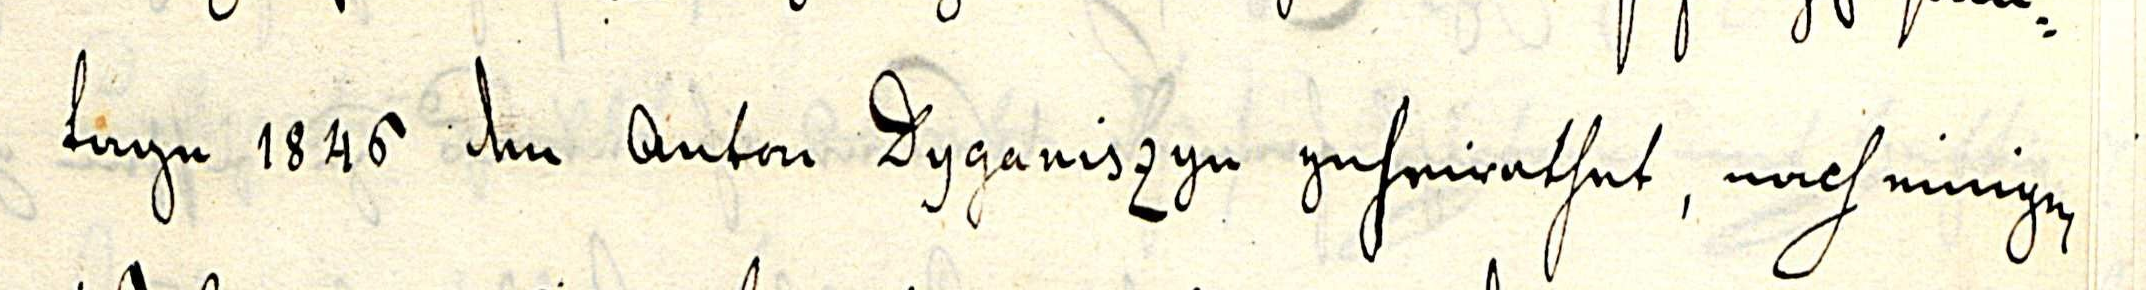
tage 1846 den Anton Dyganiszyn geheirathet, nach einigen
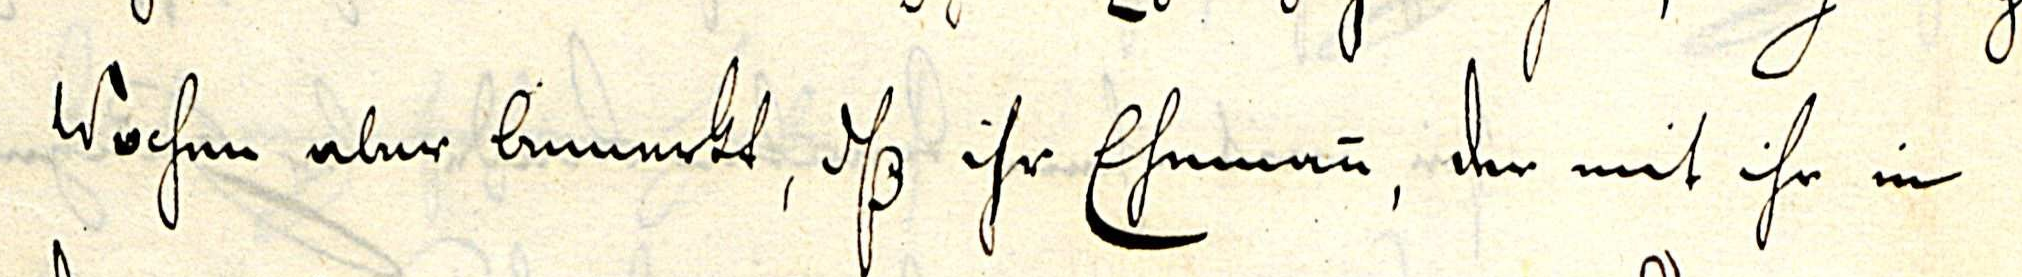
Wochen aber bemerkt, daß ihr Ehemann, der mit ihr in
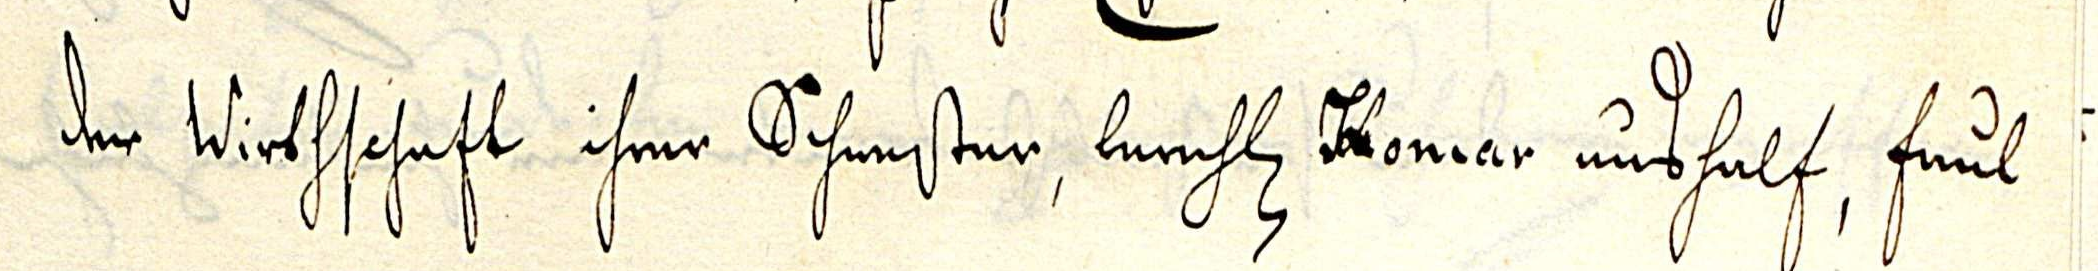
der Wirtschaft ihrer Schwester, verehl Komar aushalf, faul
